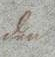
den
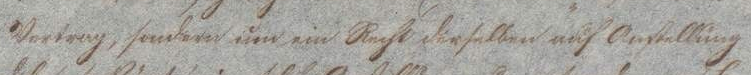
Vertrag, sondern um ein Recht derselben auf Anstellung
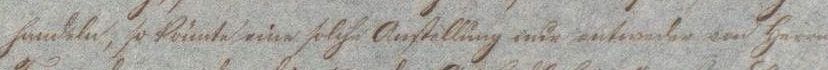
handeln, so könnte eine solche Anstellung nur entweder von Herrn
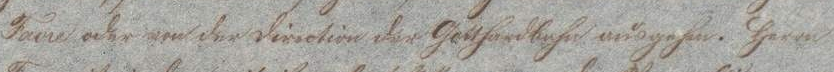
Favre oder von der Direction der Gotthardbahn ausgehen. Herrn
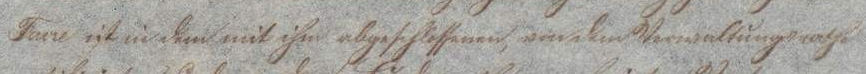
Favre ist in dem mit ihm abgeschlossenen, von dem Verwaltungsrathe
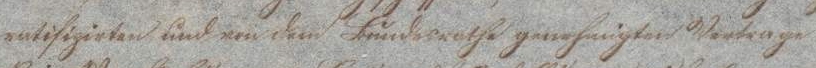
ratifizirten und von dem Bundesrathe genehmigten Vertrage
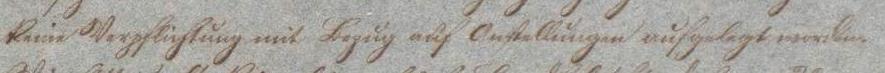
keine Verpflichtung mit Bezug auf Anstellungen aufgelegt worden.
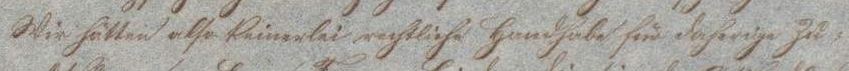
Wir hätten also keinerlei rechtliche Handhabe für daherige Zu-
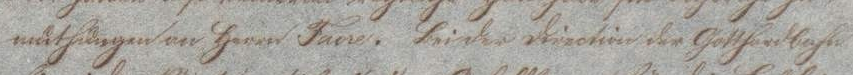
muthungen an Herrn Favre. Bei der Direction der Gotthardbahn
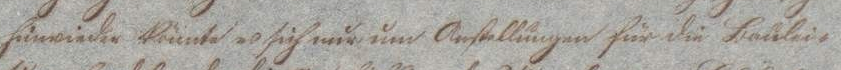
hinwieder könnte es sich nur um Anstellungen für die Baulei-
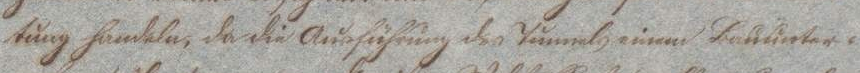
tung handeln, da die Ausführung des Tunnels einem Bauunter-
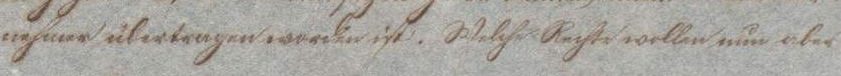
nehmer übertragen worden ist. Welche Rechte wolen nun aber
